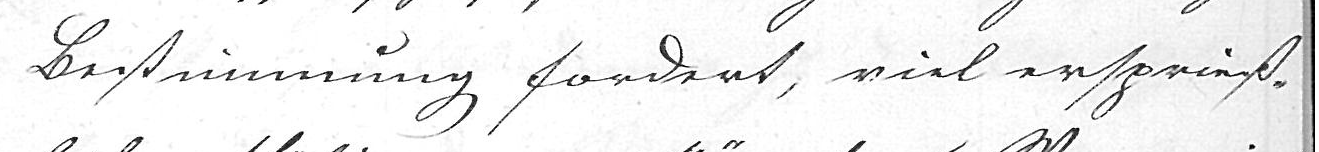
Bestimmung fordert, viel ersprieß-
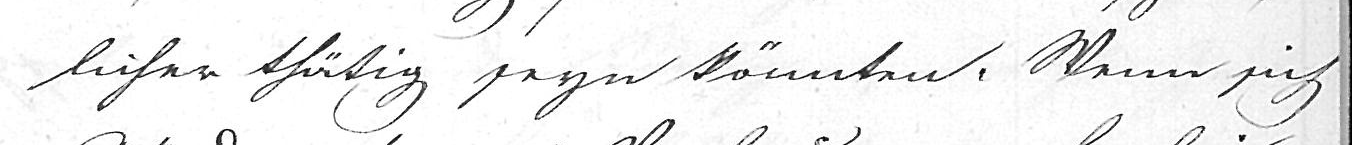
licher thätig seyn könnten. Wenn sich
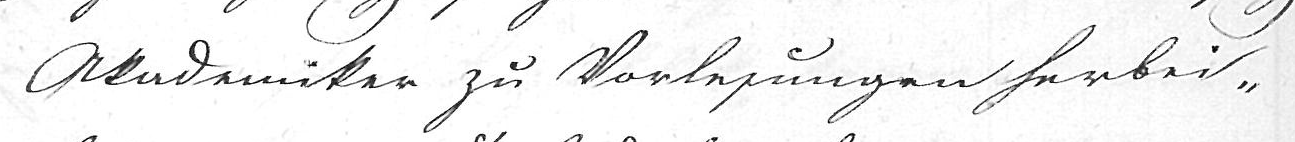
Akademiker zu Verlesungen hierbei-
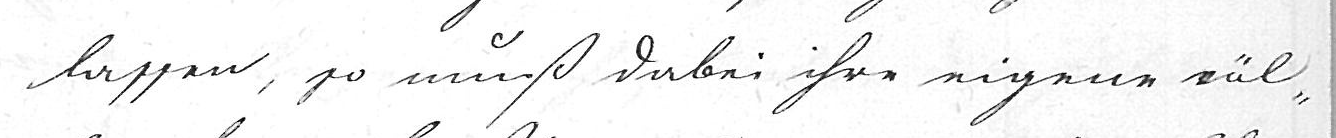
lassen, so muß dabei ihre eigene völ-
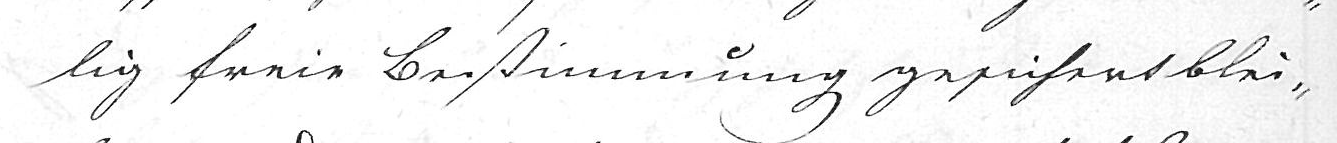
lig freie Bestimmung gesichert blei-
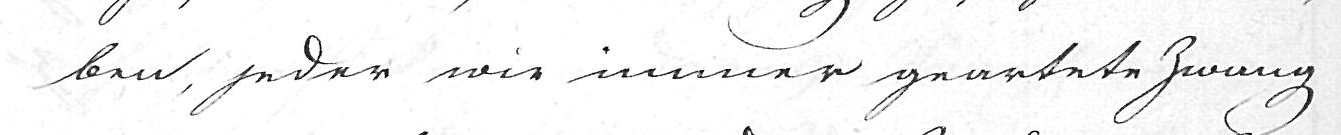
ben, jeder wie immer geartete Zwang
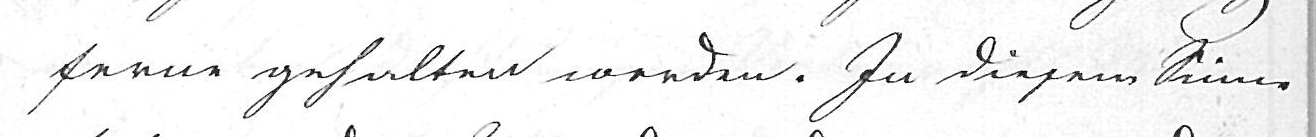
ferne gehalten werden. In diesen Sinne
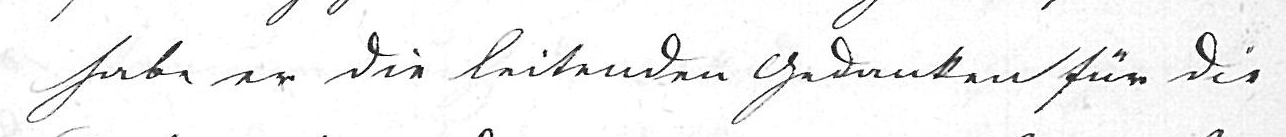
habe er die leitenden Gedanken für die
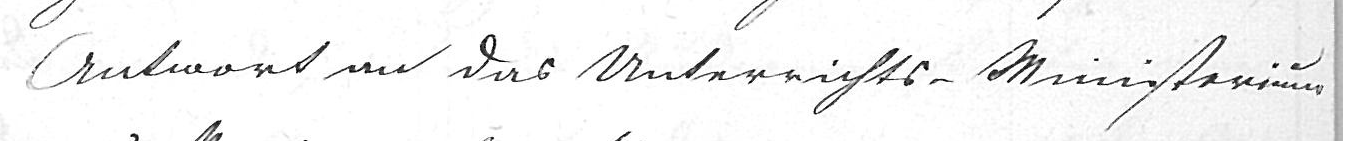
Antwort an das Unterrichts-Ministerium
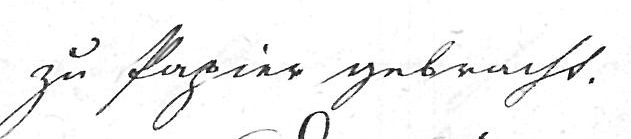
zu Papier gebracht.
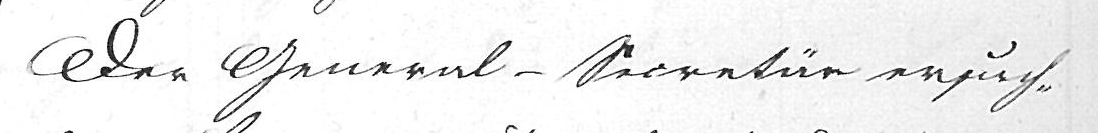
Der General-Secretär ersuch-
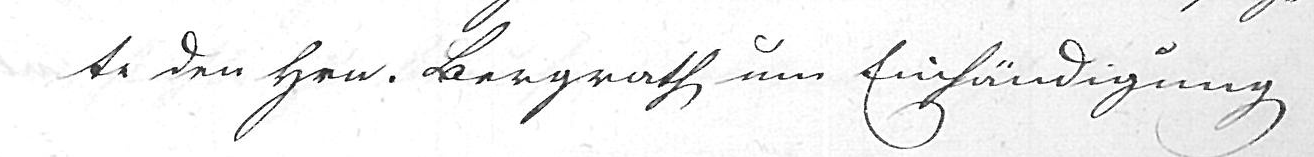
te den Hrn. Bergrath um Einhändigung
